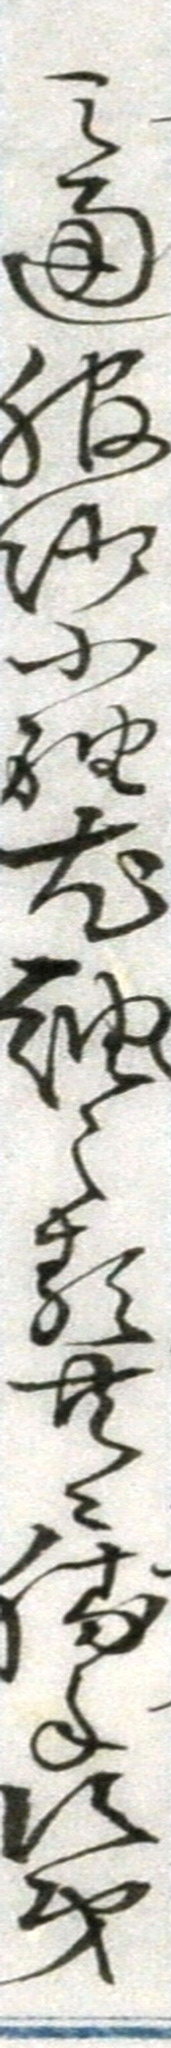之通服紗小袖尤紬之類共ニ勝手次第
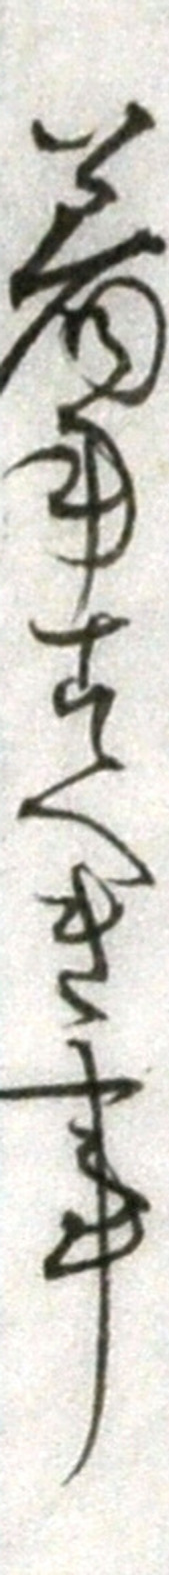着用すへき事
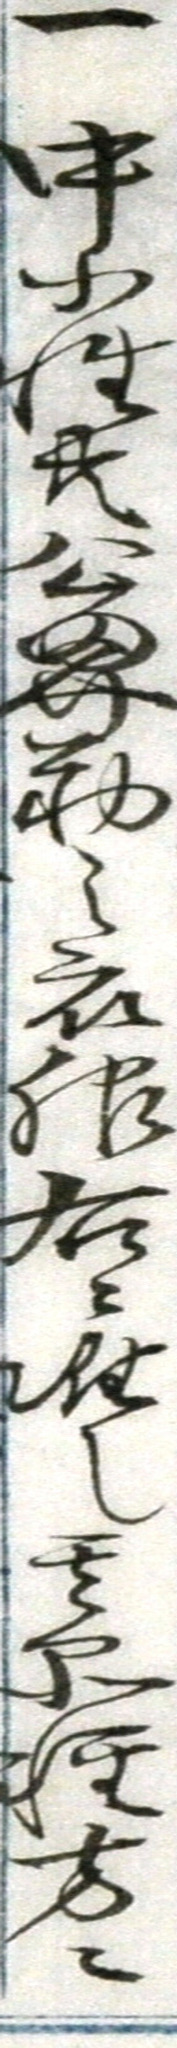一中小性共公界勤之衣服右ニ准し其品軽方ニ
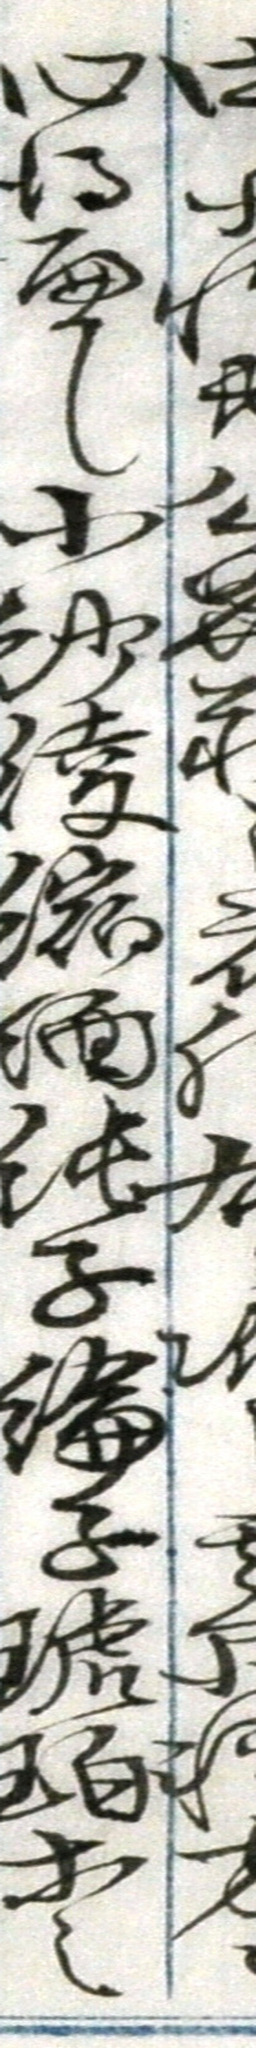心得へし小紗綾縮緬純子綸子琥珀等之
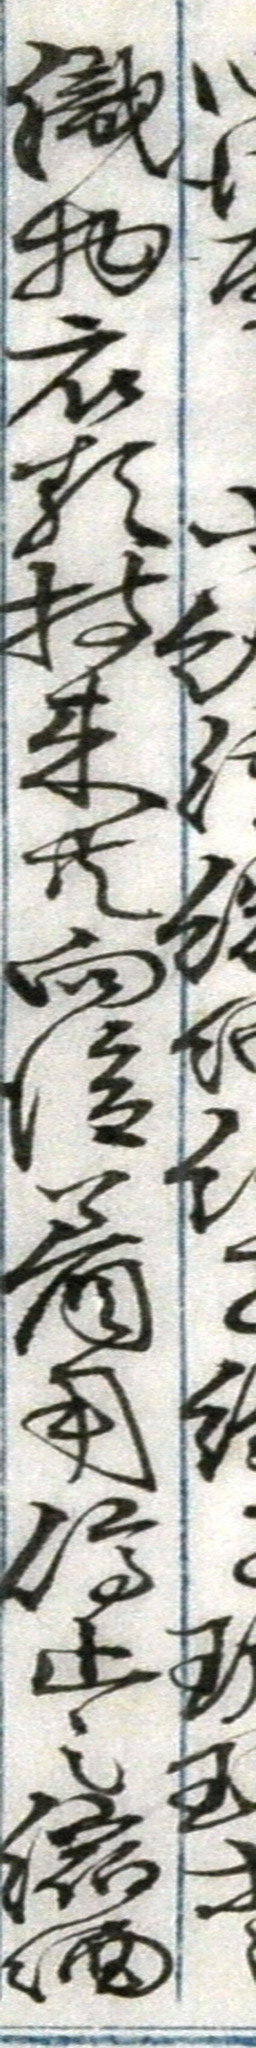織物衣類持来共向後着用停止之縮緬
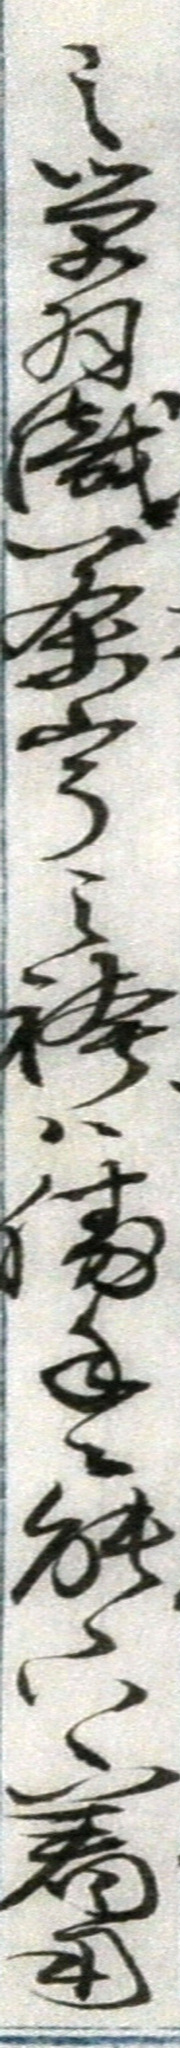之単羽織茶宇之袴ハ勝手ニ能候ハヽ着用
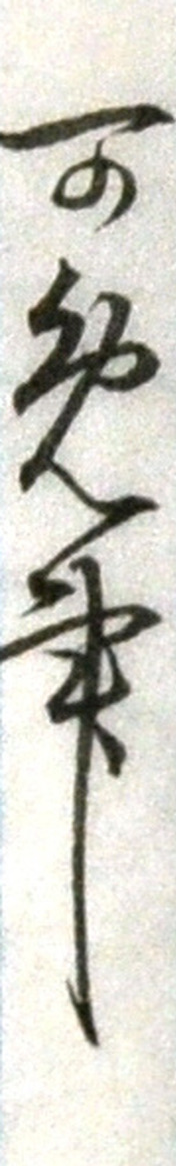可免事
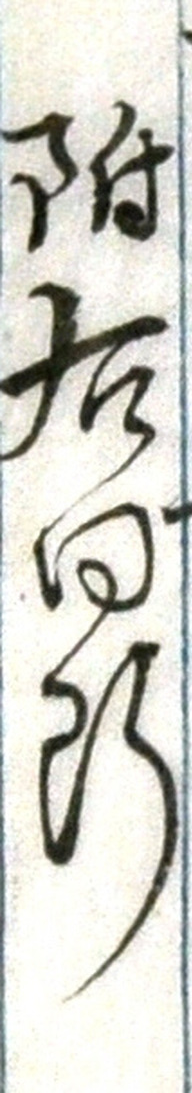附右同断

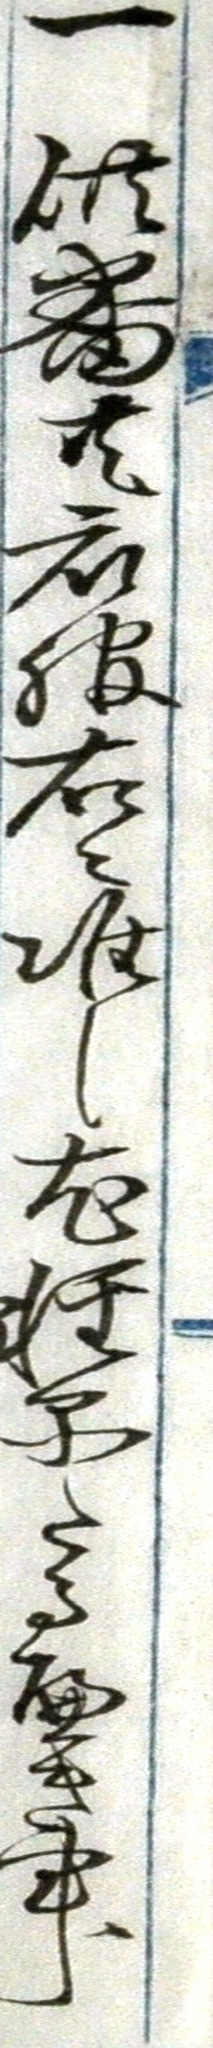一供番共衣服右ニ准し尤軽品たるへき事
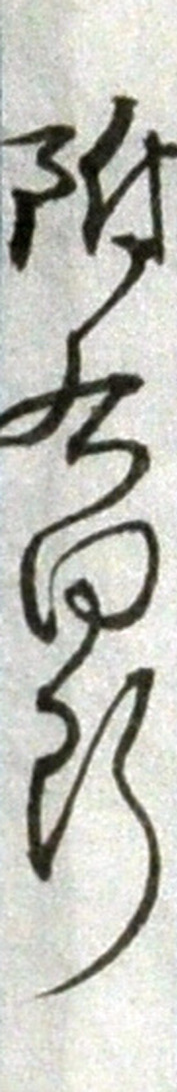附右同断
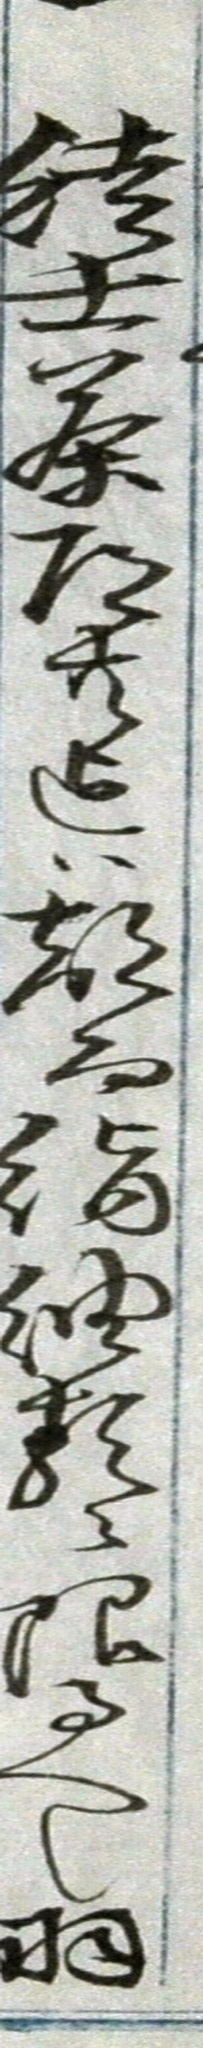一諸士茶道共迄ハ都而絹紬類ニ限るへし羽
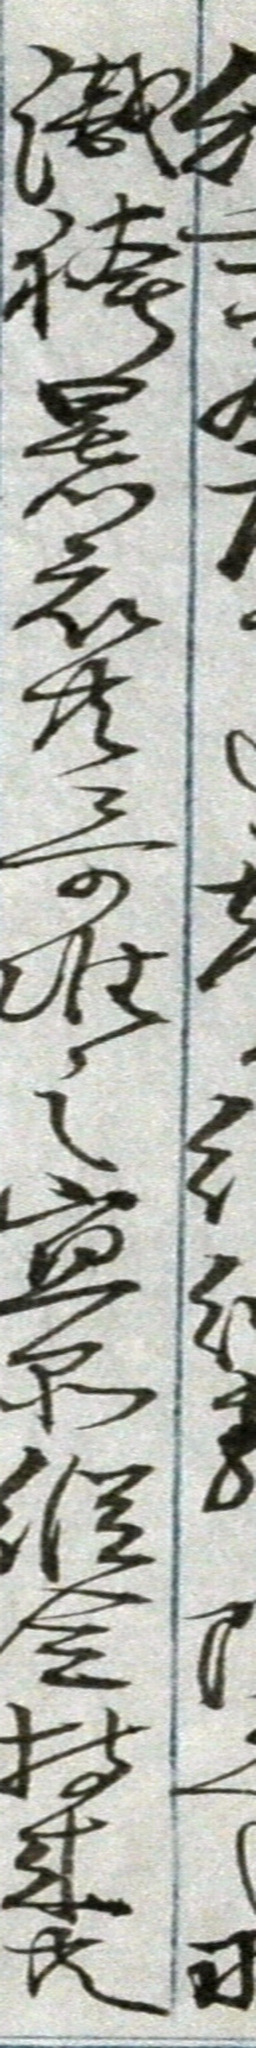織袴暑衣共ニ可准之宜品縦令持来共
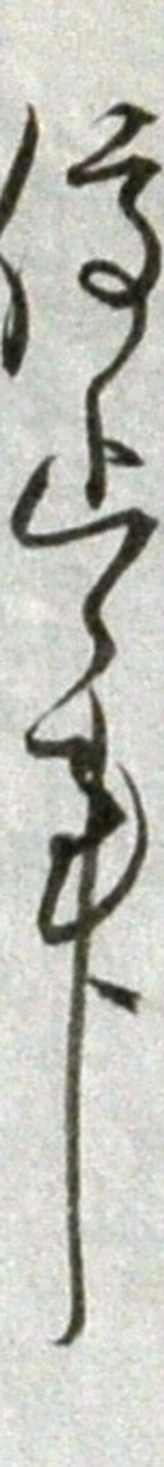停止之事
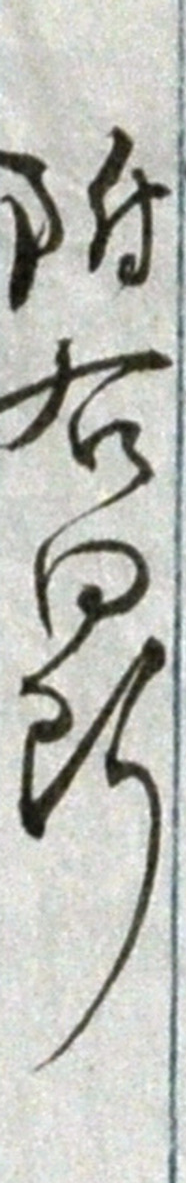附右同断
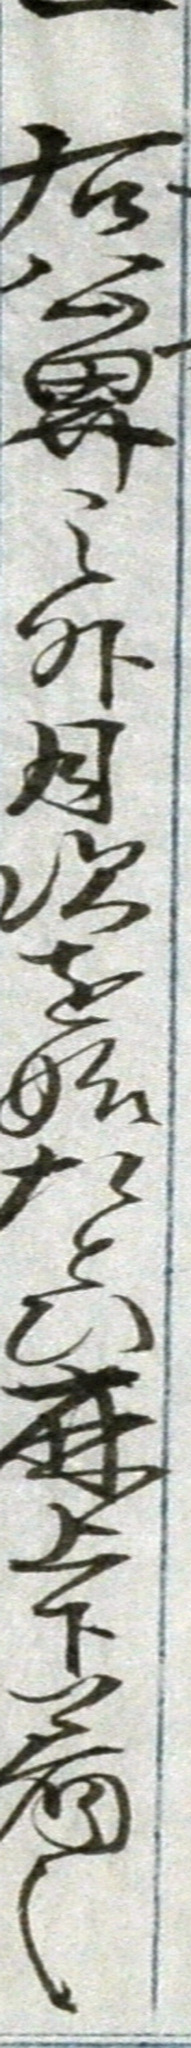一右公界之外月次を始たとひ麻上下着し
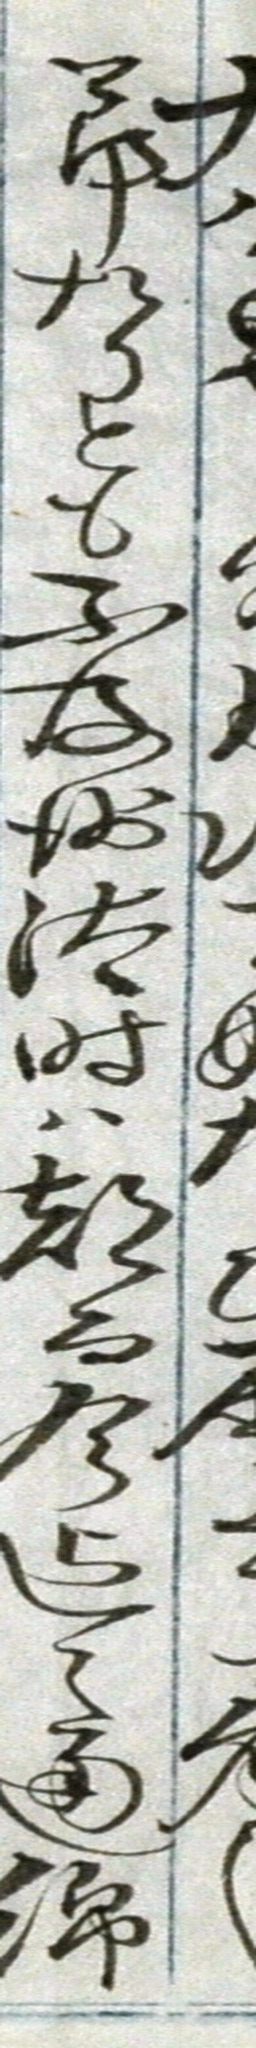節たりとも不及沙汰時ハ都而今迄之通綿
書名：頼由公（源隆院殿）御定
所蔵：伊那市立高遠町図書館・合同会社AMANE
